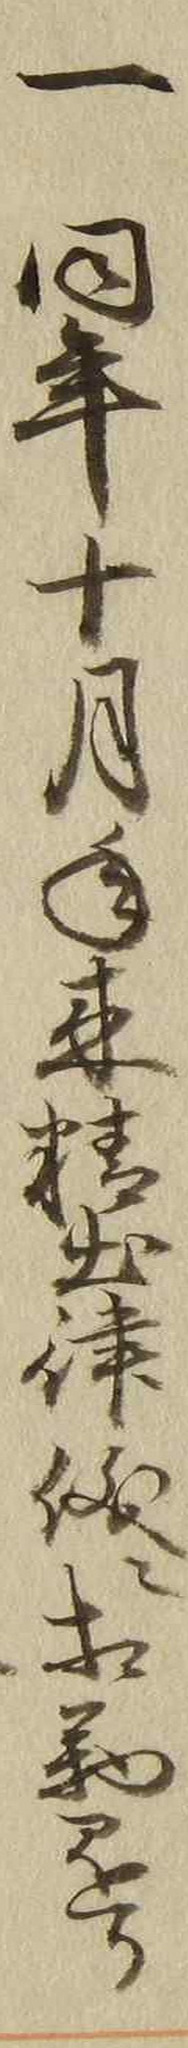一同年十月年来精出律儀ニ相勤懸り
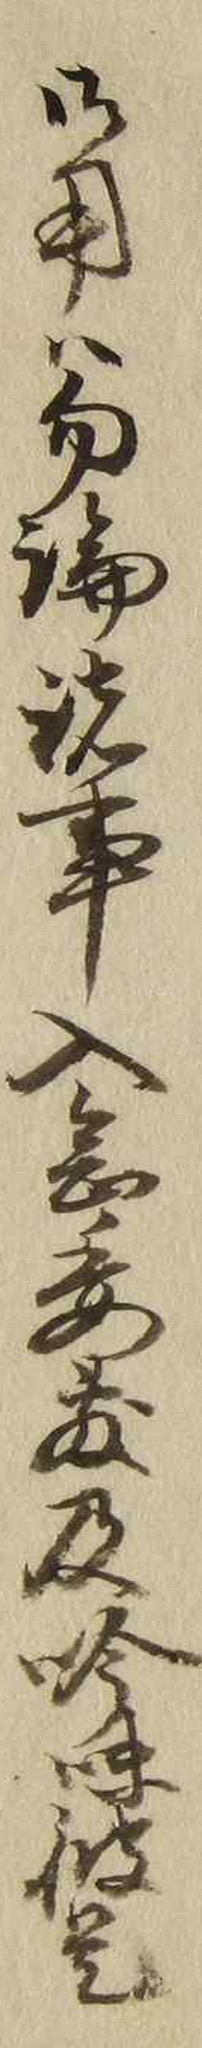御用ハ勿論諸事入念委敷及吟味彼是

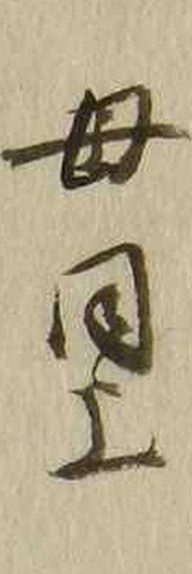母同上
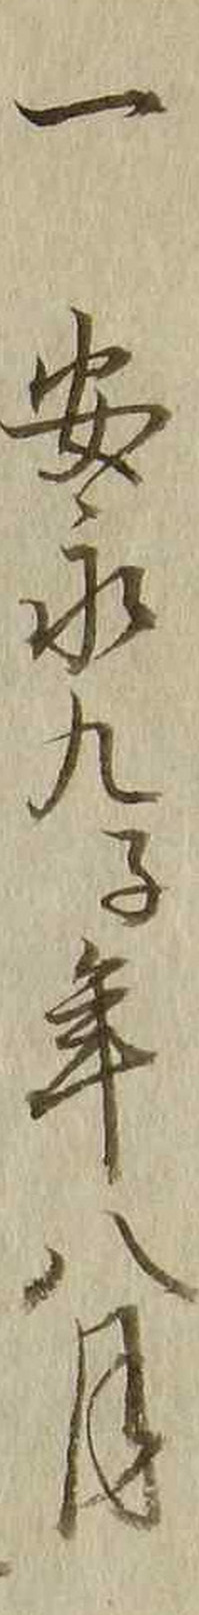一安永九子年八月
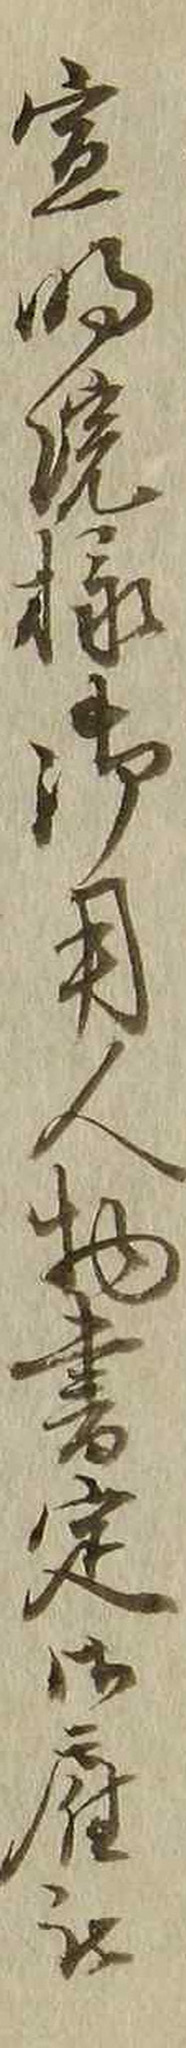宣明院様御用人物書定御雇被
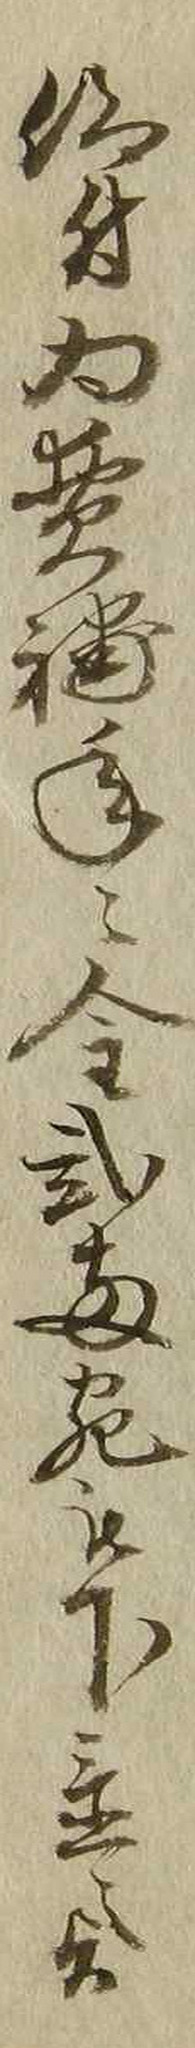仰付為費補年々金弐両宛被下置之旨
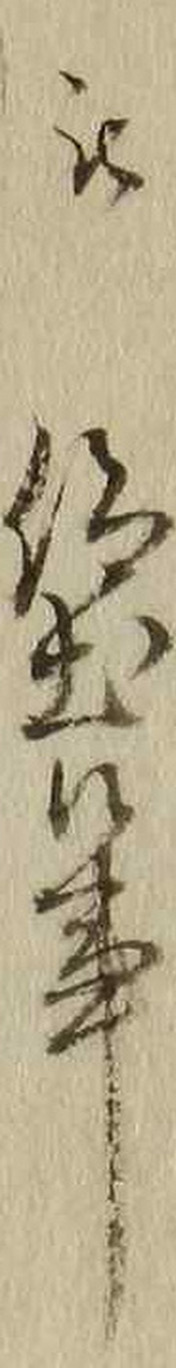被仰出候事
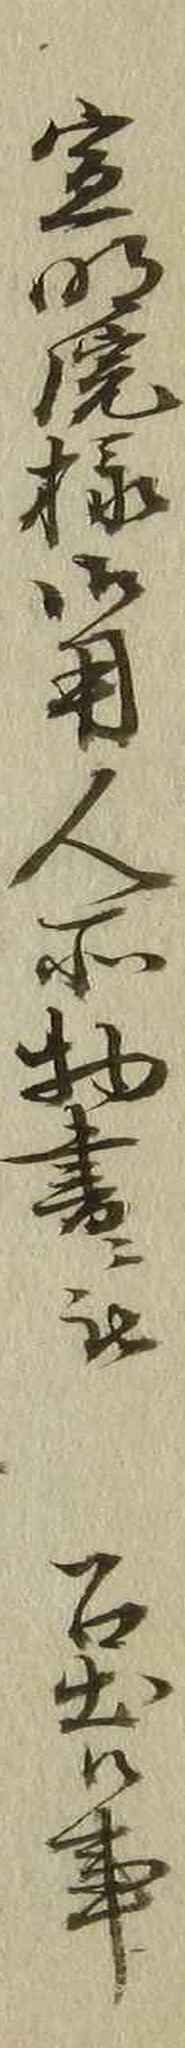宣明院様御用人所物書ニ被召出候事
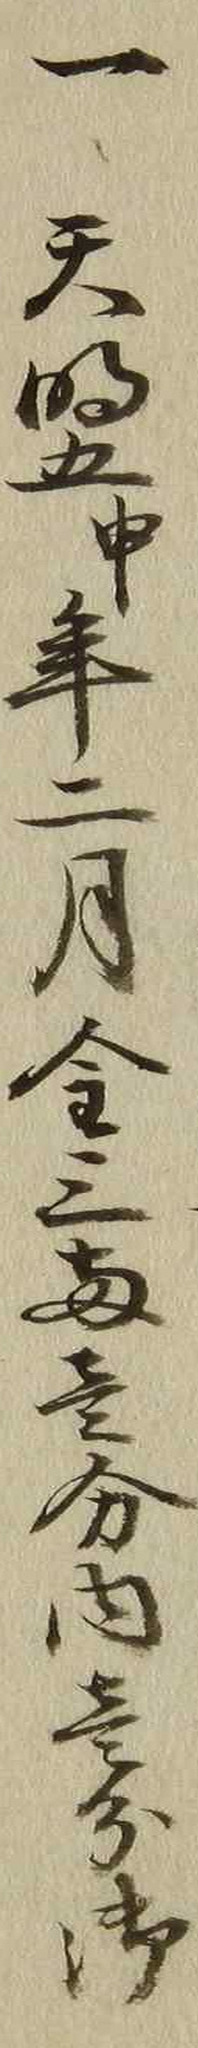一天明五申年二月金三両壱分内壱分御
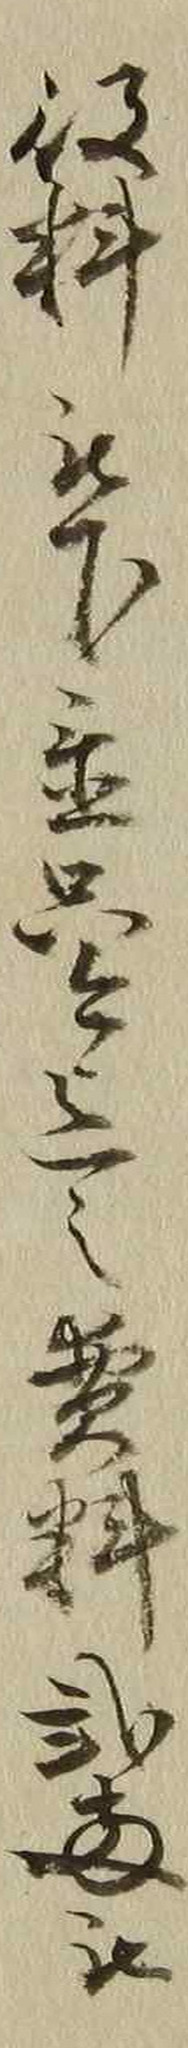役料被下置只今迄之費料弐両被
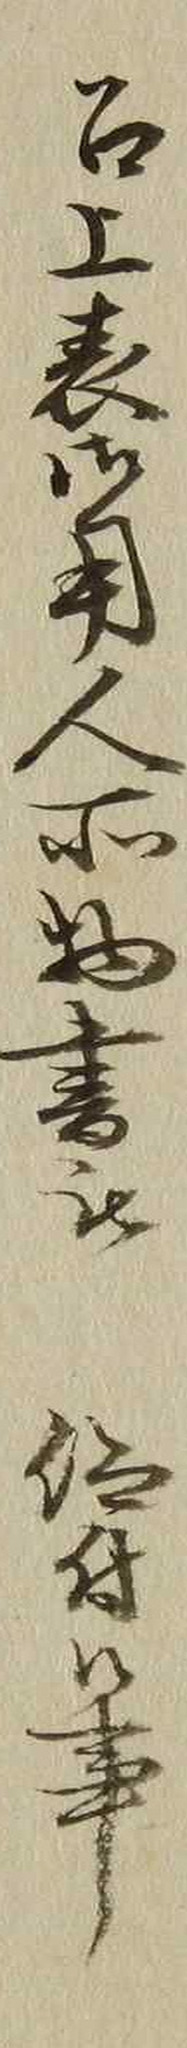召上表御用人所物書被仰付候事
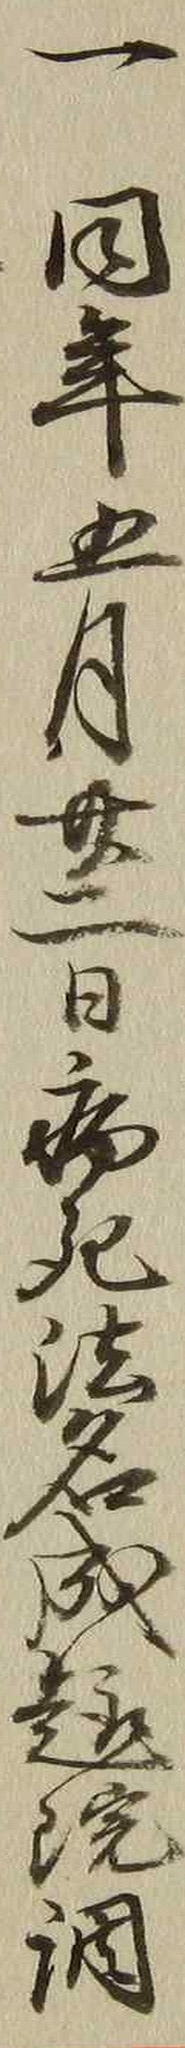一同年五月廿二日病死法名成趣院調
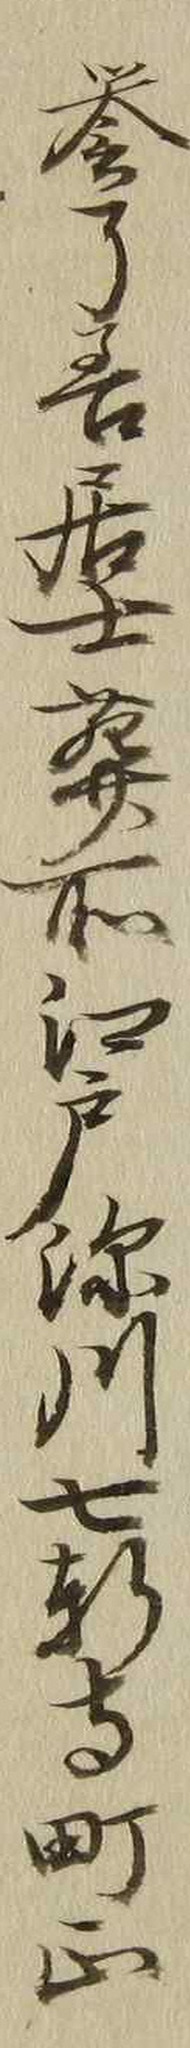誉了善居士葬所江戸深川七軒寺町正
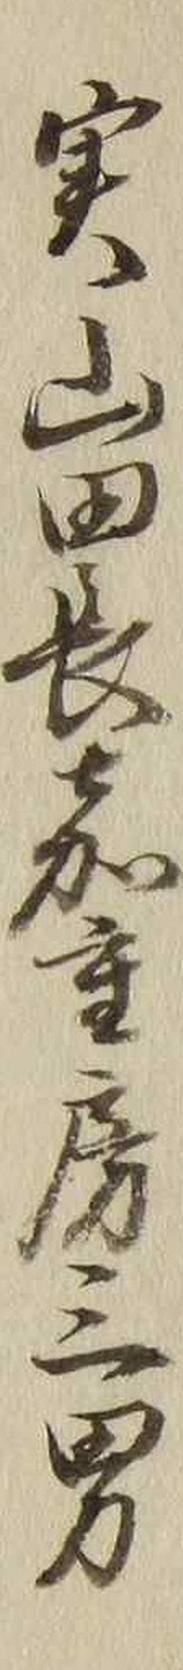実山田長嘉重房三男

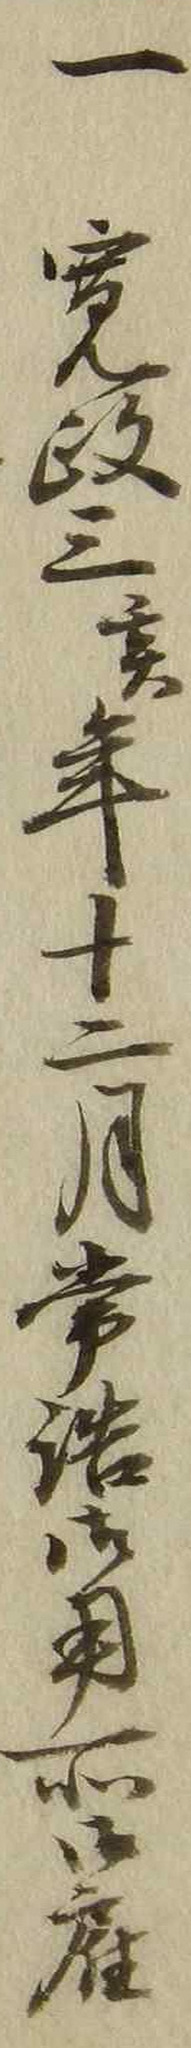一寛政三亥年十二月常詰御用所御雇
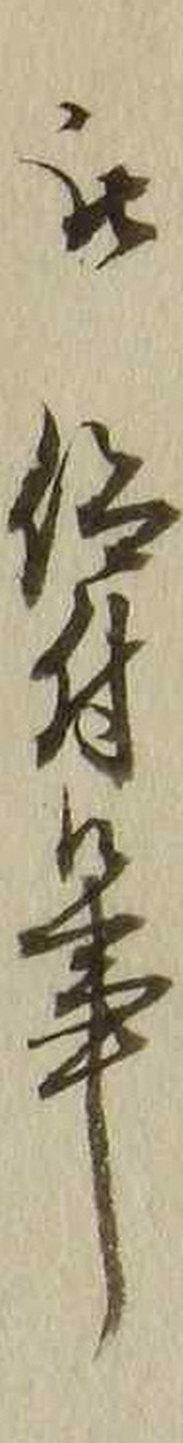被仰付候事
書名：諸士系譜　巻之64　と之部7
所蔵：会津若松市立会津図書館
